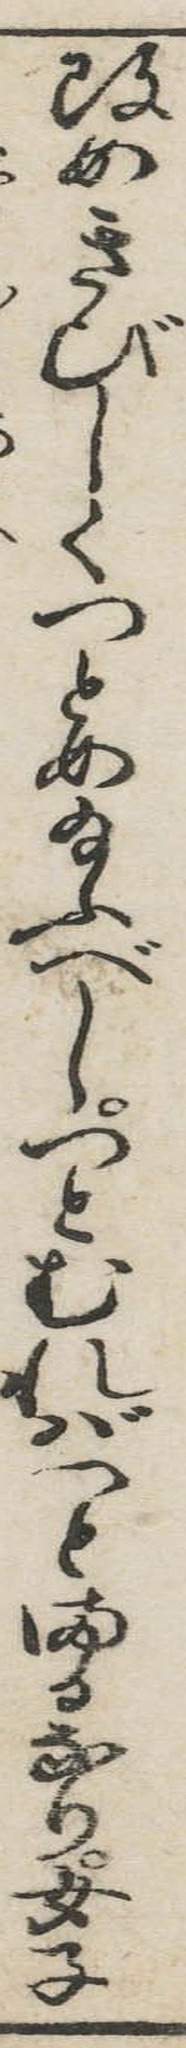改めきびしくつとめ給ふべし。つとむればつとまるなり。女子
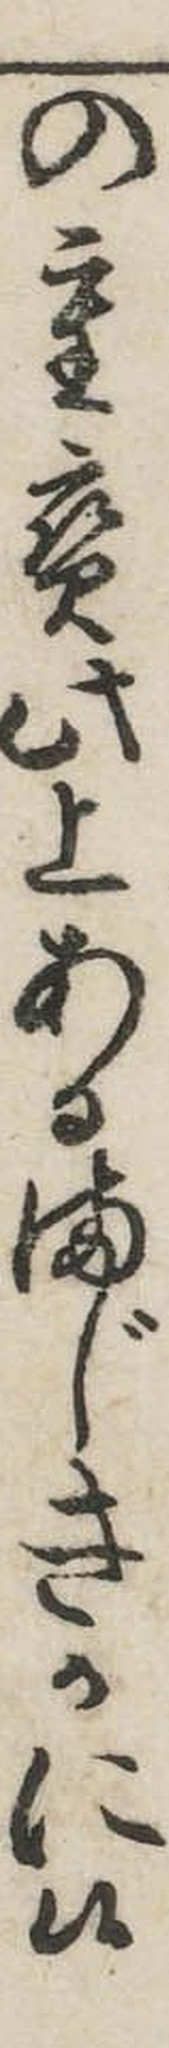の重宝此上あるまじきかに候

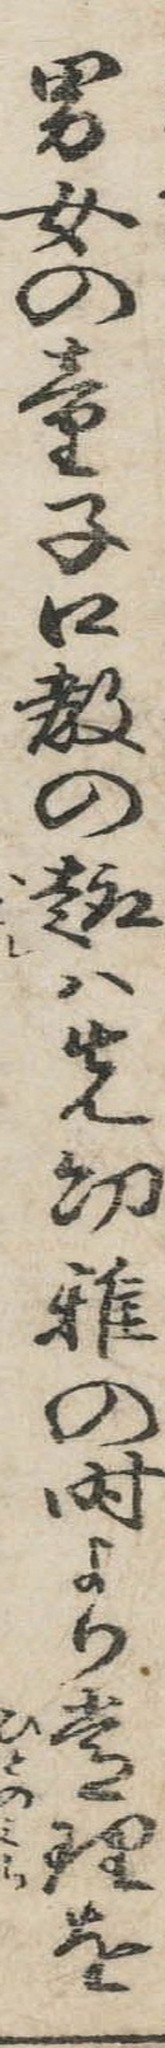男女の童子口教の趣は先幼稚の時より常理を
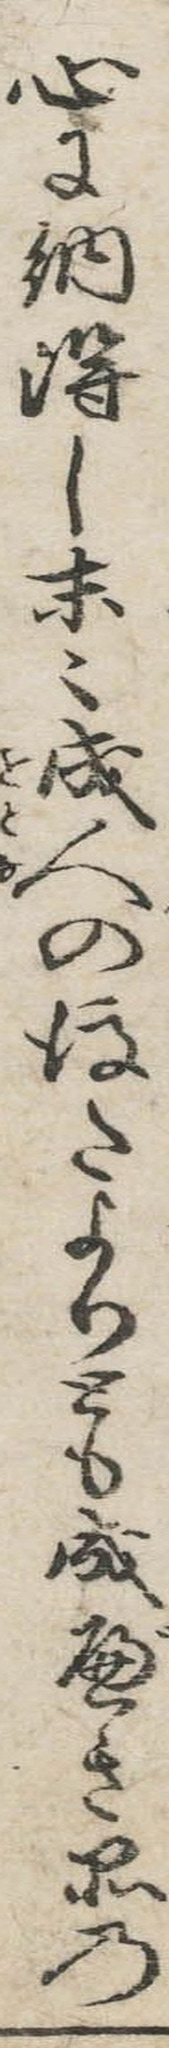心に納得し末々成人の後たよりとも成べき品乃
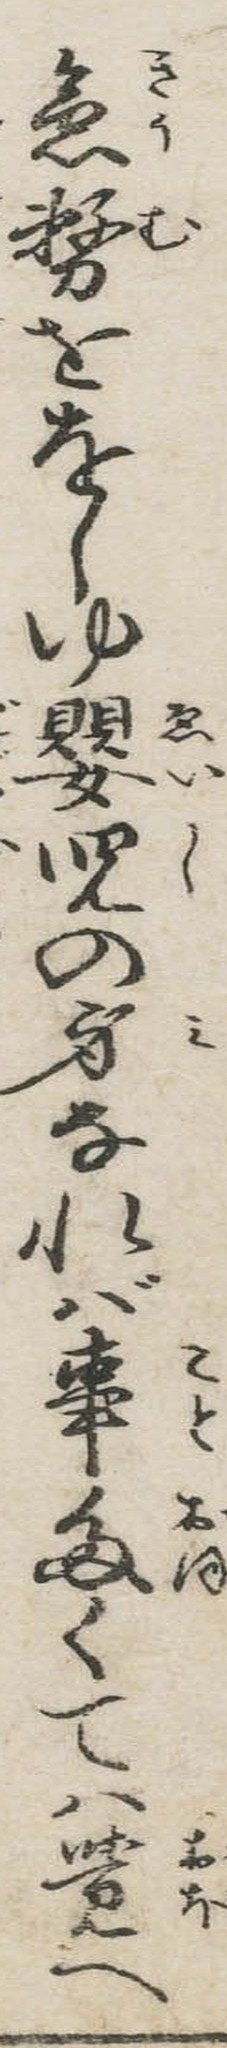急務ををしゆ嬰児の身なれば事多くては覚へ
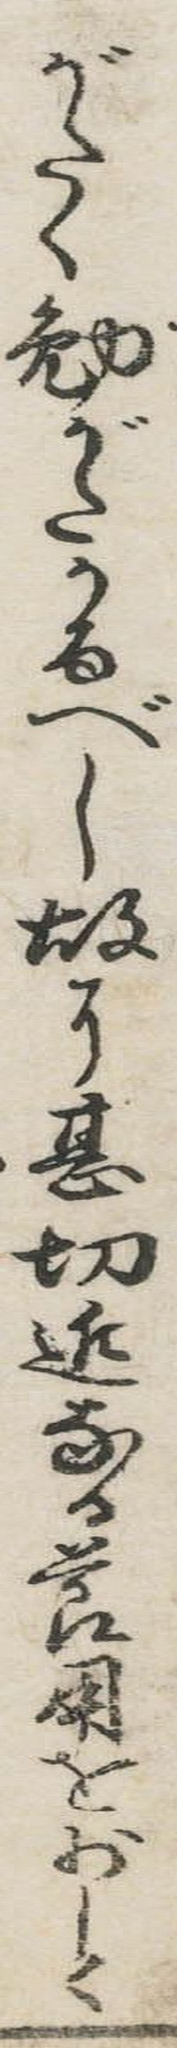がたく勉がたかるべし故に甚切近なる節用を少しく
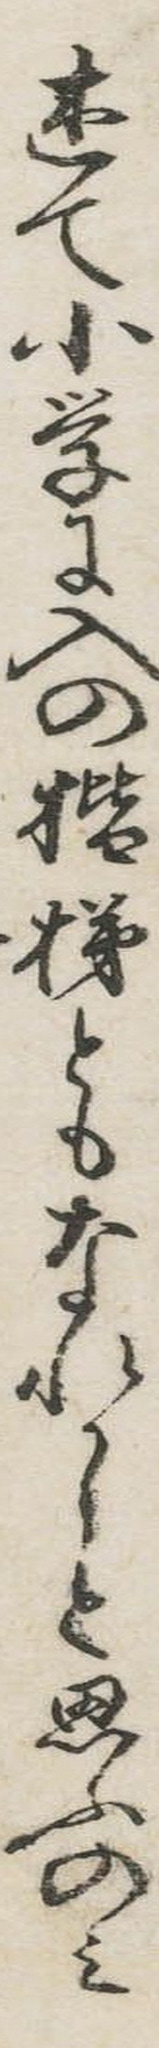述て小学に入の階梯ともなれかしと思ふのみ
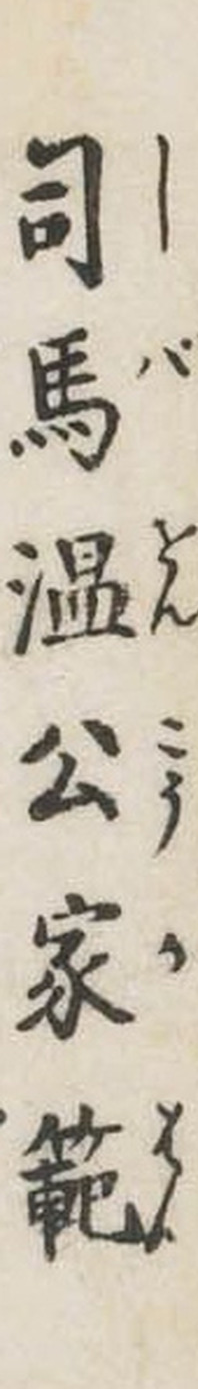付録司馬温公家範
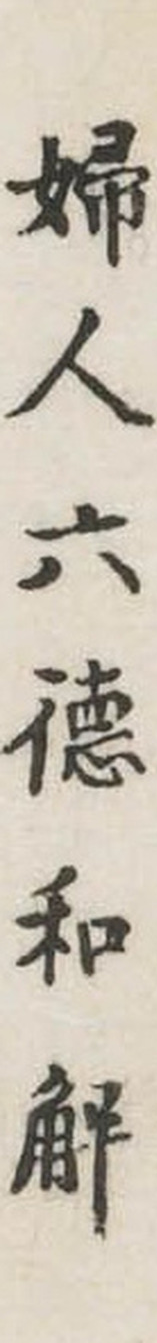婦人六徳和解
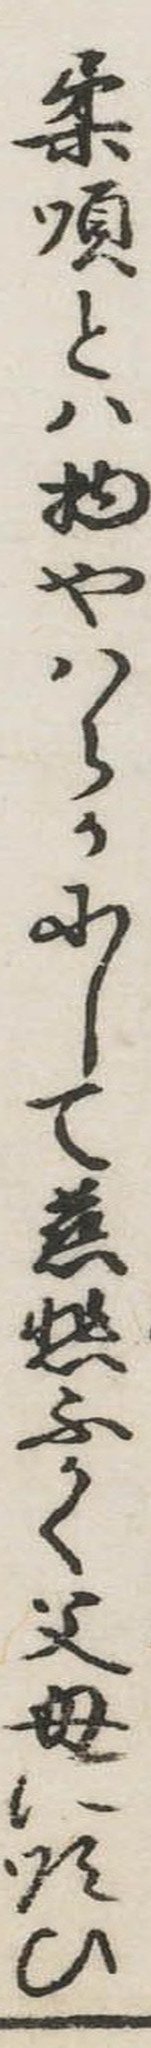柔順柔順とは物やはらかにして慈悲ふかく父母に順ひ
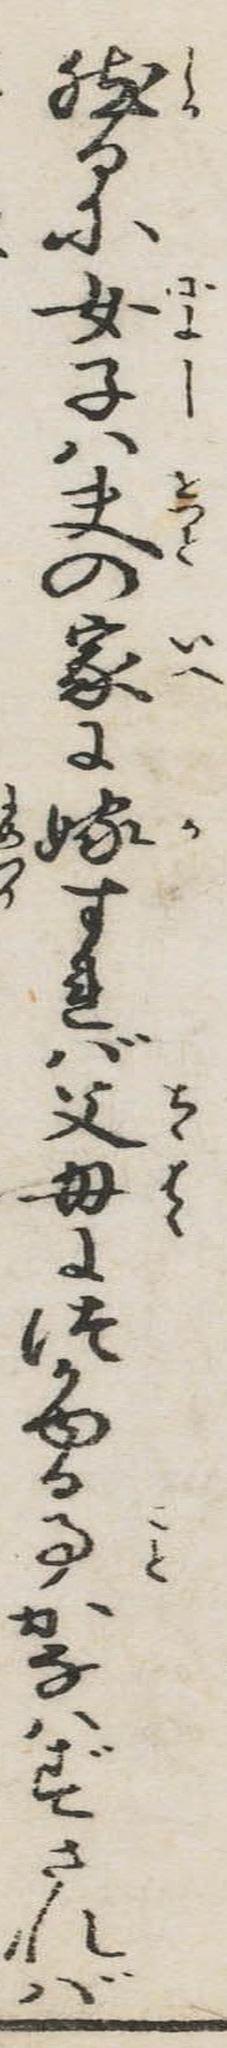然るに女子は夫の家に嫁すれば父母につかゆる事かなはずされば
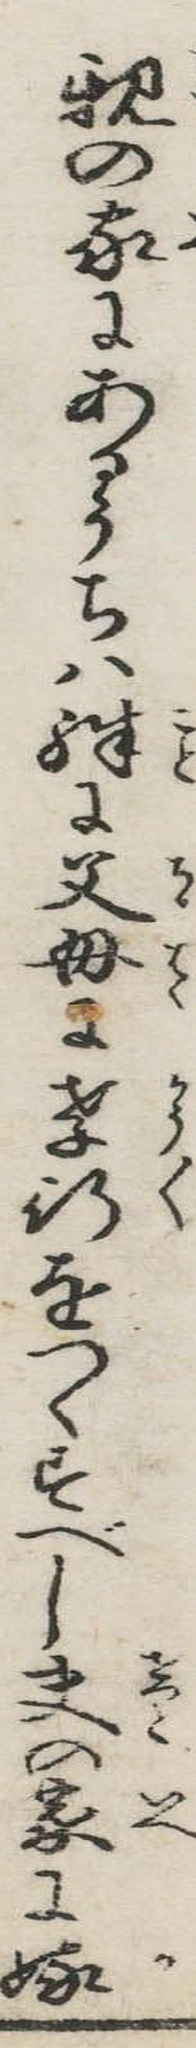親の家にあるうちは殊に父母に孝行をつくすべし夫の家に嫁
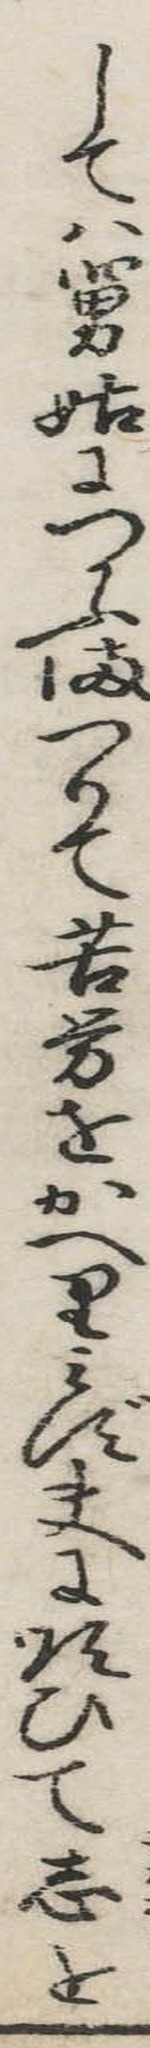しては舅姑につかふまつりて苦労をかへりみず夫に順ひて志を
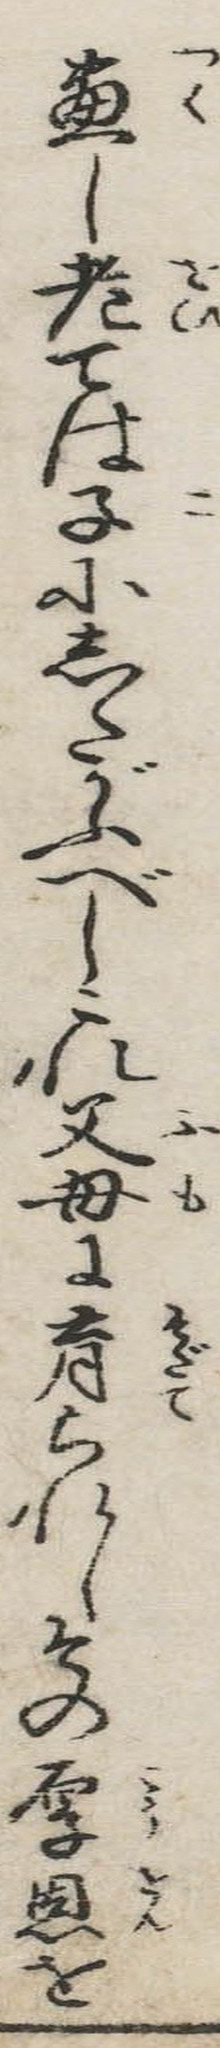尽し老ては子にしたがふべしこれ父母に育られしその厚恩を
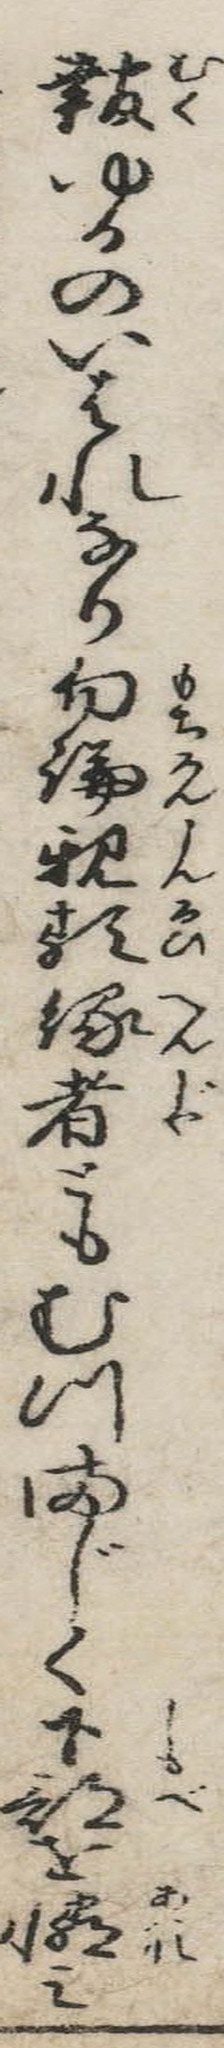報ゆるのいはれなり勿論親類縁者ともむつまじく下部を憐み
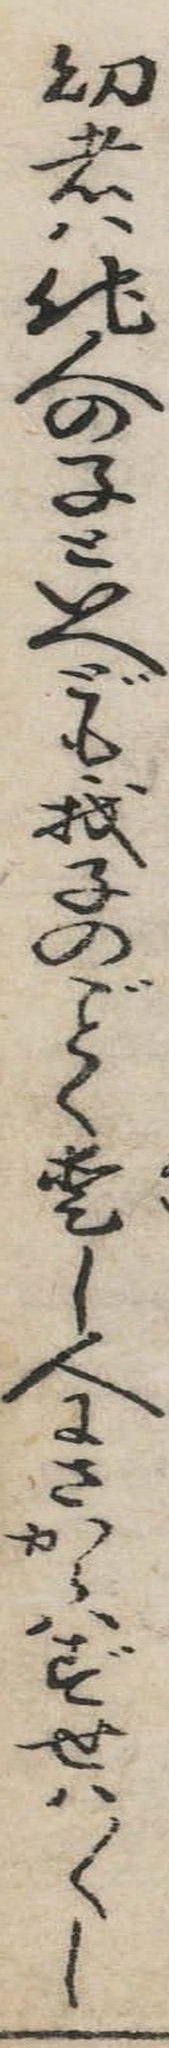幼者は他人の子といへども我子のごとく愛し人にさからはずせは〳〵し
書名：前訓
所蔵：東京学芸大学附属図書館
